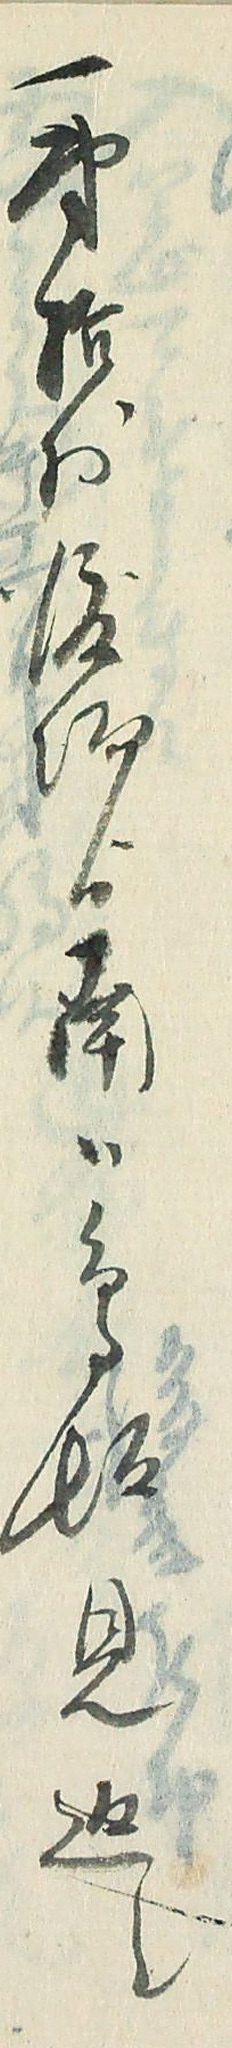一第拾村渡場ゟ南は鳥坂見返し
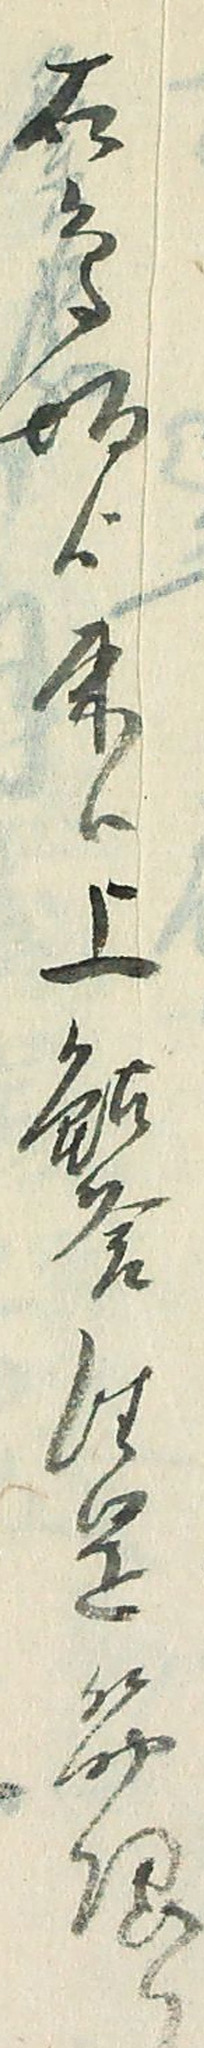右鳥坂ゟ東は上鮎喰往還筋限り
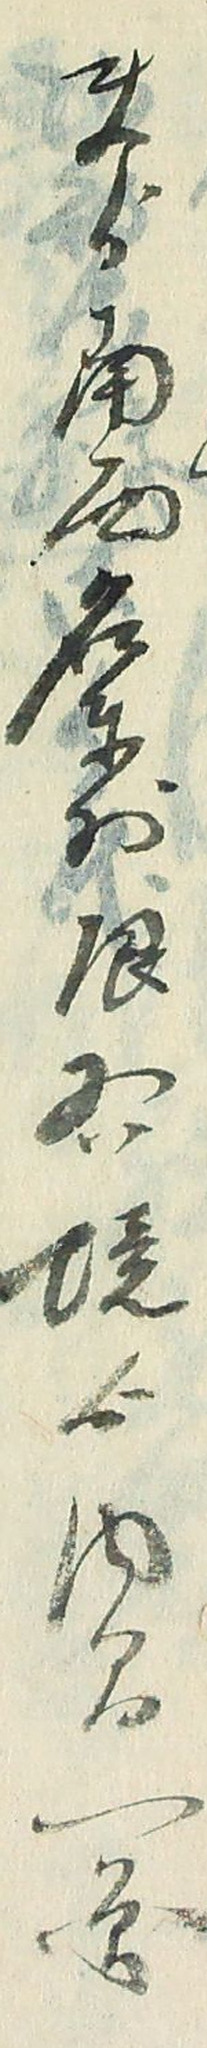夫ゟ南西名東村限右境ゟ内間一円
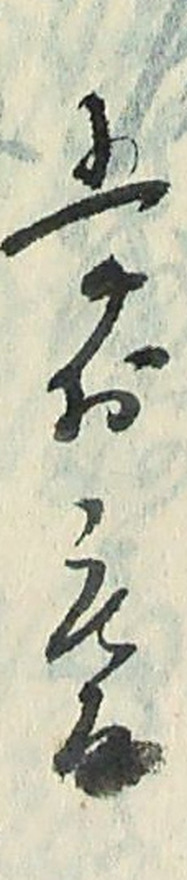五ケ村庄屋
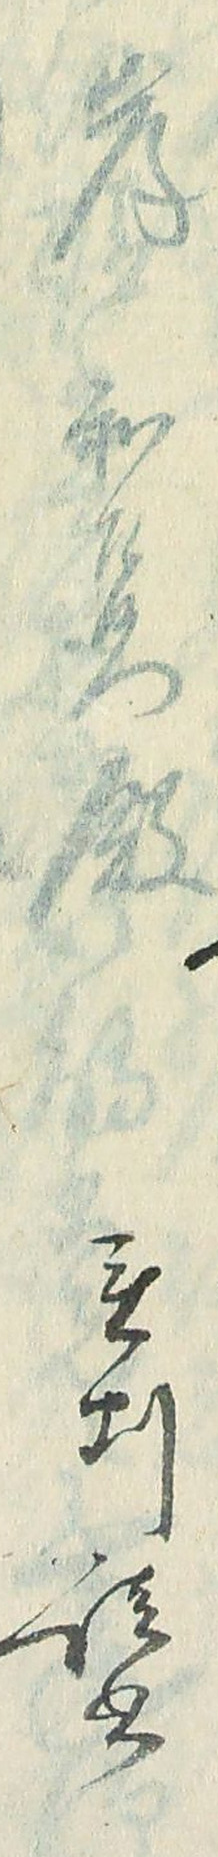連判請書
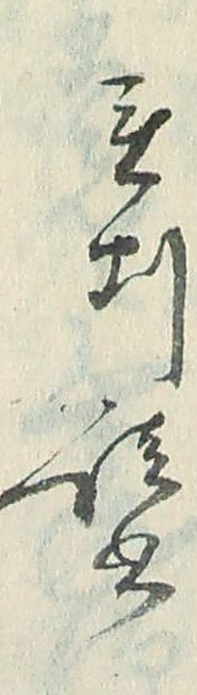連判請書
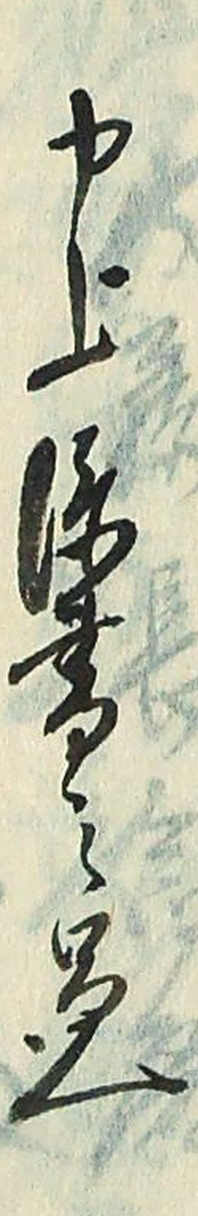申上添書之覚
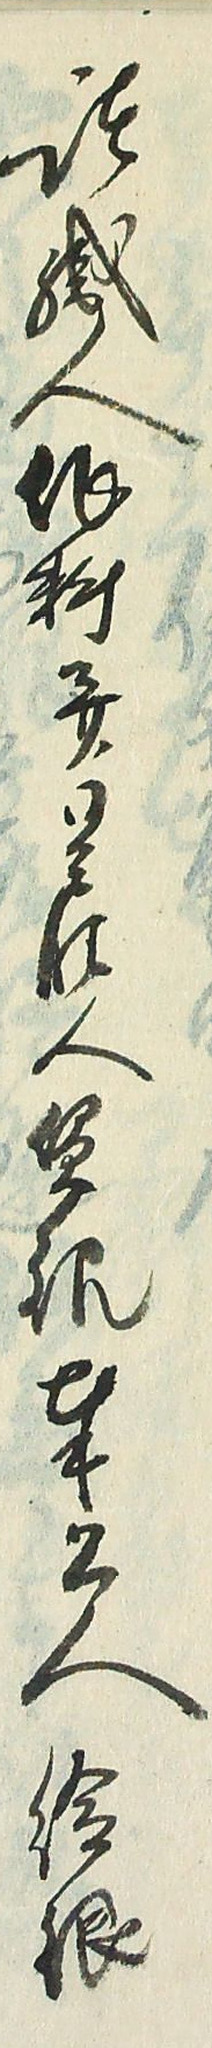諸職人作料幷日雇人賃銀奉公人給銀
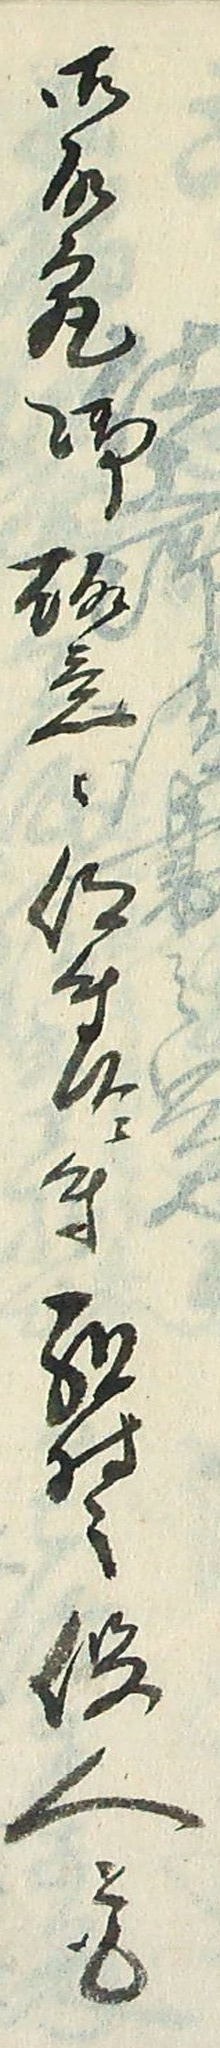御取究御趣意被仰付候に付組村々役人とも
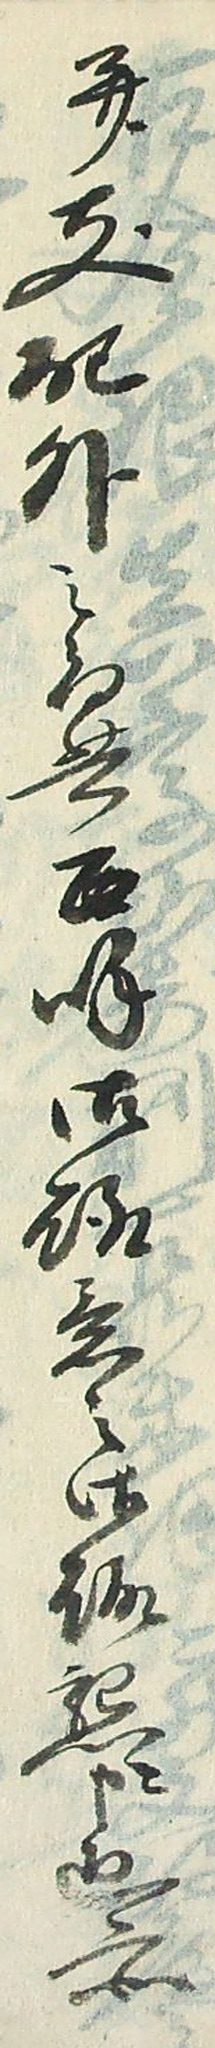幷支配外之者共召呼御趣意之御趣懇に申通候所
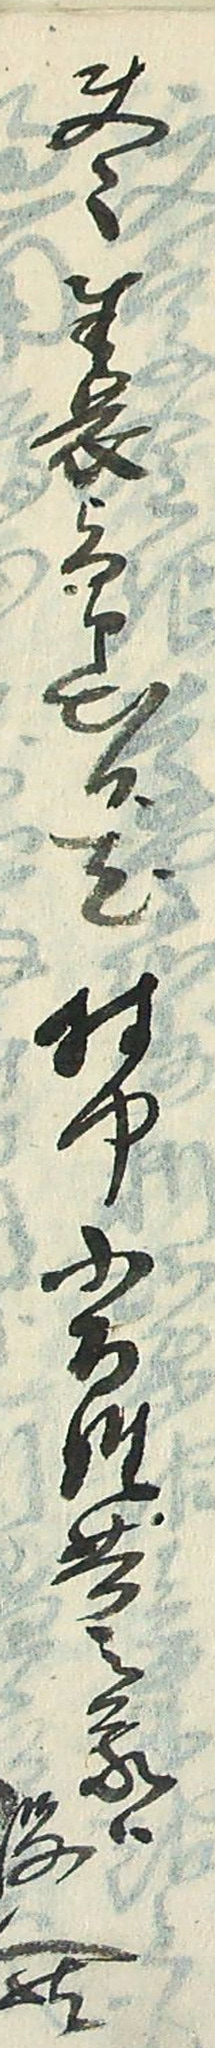夫々奉畏旨申出候尤村中小百姓共之義は
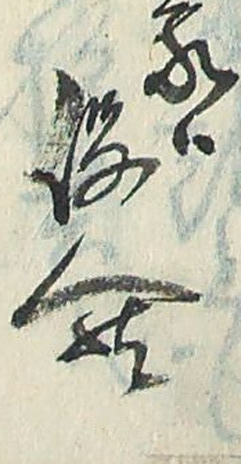役人共

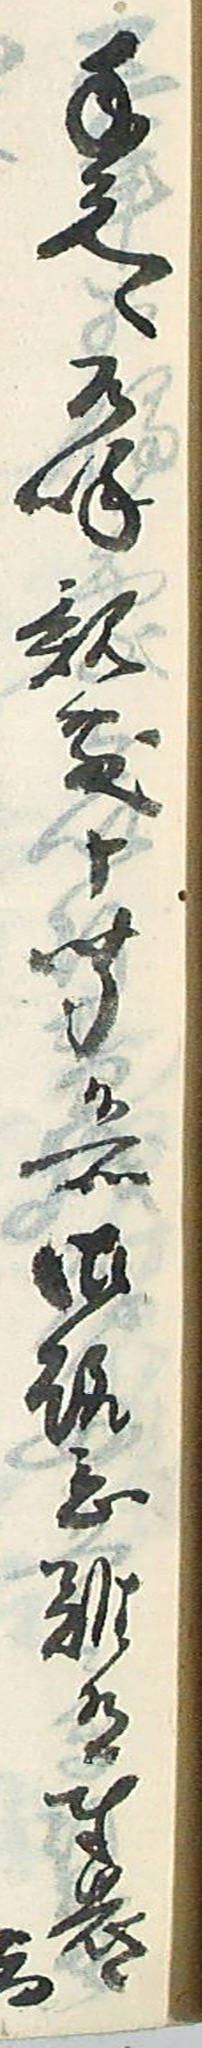手元へ召呼親敷申聞候所御趣意難有奉畏候旨
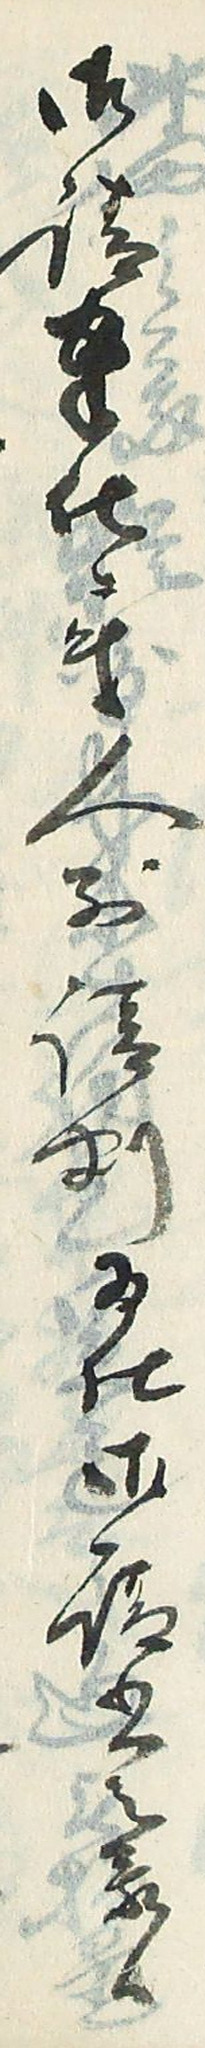御請奉仕に付き人別請判為仕御請書之義は
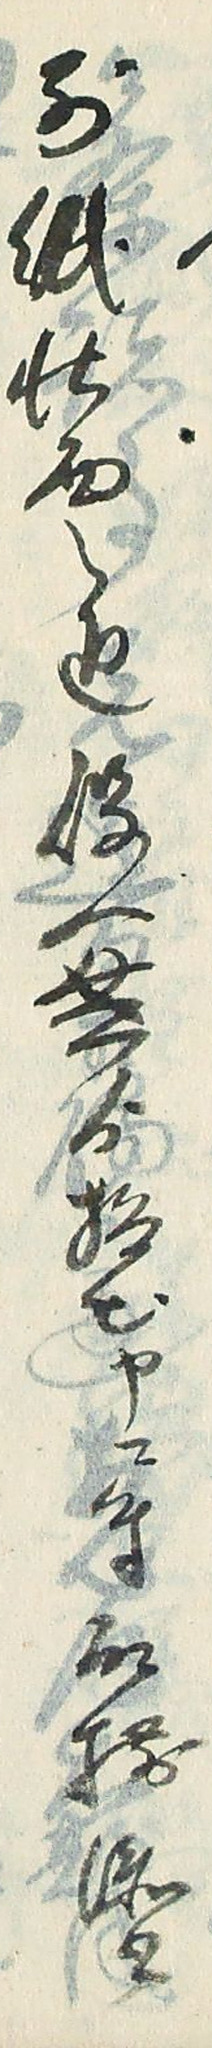別紙帳面之通役人共ゟ指出申に付取揃添書
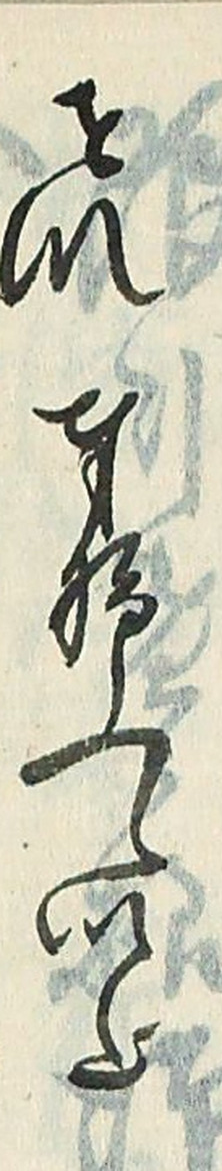を以奉指上候以上
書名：諸御用御□受書控
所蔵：鳴門教育大学 Naruto University of Education
